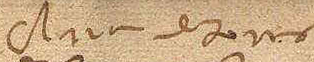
Ana de tores
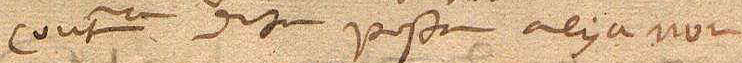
Contradita posta a lyanor
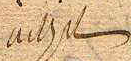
nihil
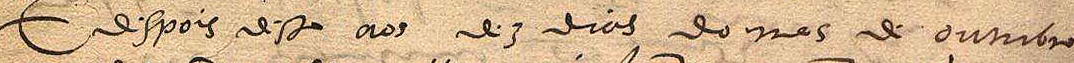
E despois desto aos dez dias do mes de outubro
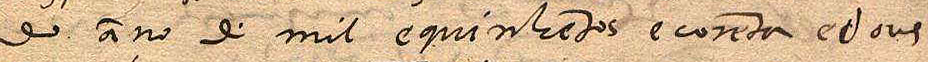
do āno de mil e quinhētos e corēta e dous
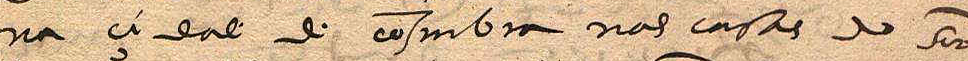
na çidade de coJmbra nas casas do s̄or
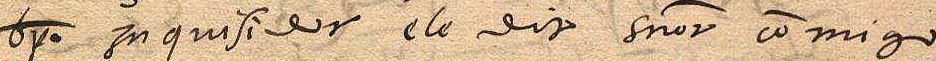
b̄po Jnquisidor ele dito snōr c̄omigo
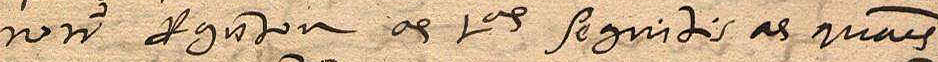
notro ꝑgūtou as tas seguites as quaes
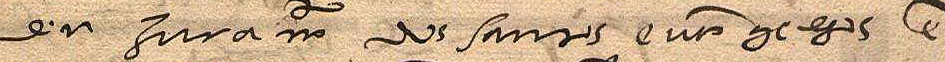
deu Juramto dos santos euāgelhos ē
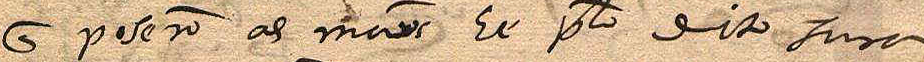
q̄ poser̄o as maõs he pl̄o dito Jura
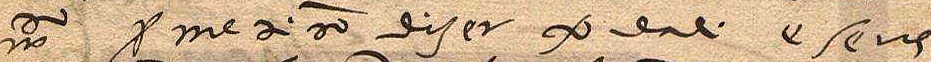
mto ꝓmeter̄o dizer ꝟdade e seus
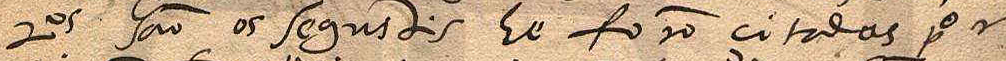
tos saõ os seguītes he for̄o çitados por
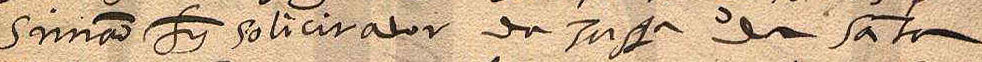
simão f̄rz solicitador da Justa da sāta
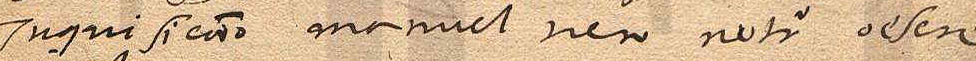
Jnquisicão manuel neto notro o escre
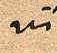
ui
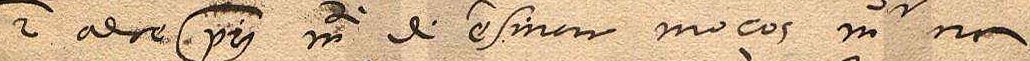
item adre p̄iz mte de ēsinar moços mor na
